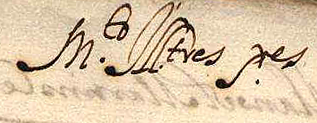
M.to Ill.res S.res
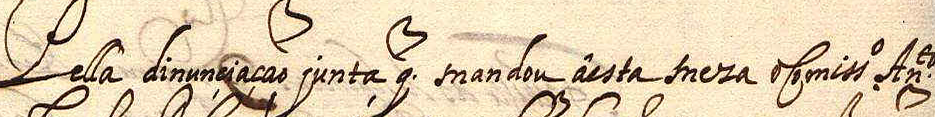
Pella dinunciaçaõ junta q̄ mandou â esta meza o Comiss.o An.to
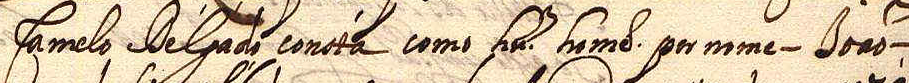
Camelo Delgado, consta como hū homē por nome – Ioaõ –
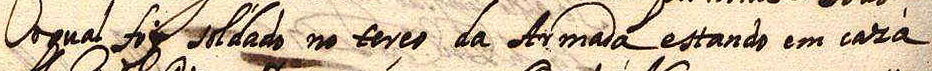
o qual foy soldado no terço da Armada, estando em caza
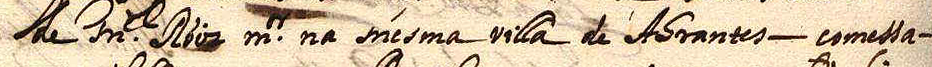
de m.el Roiz̄ m.or na mesma villa de Abrantes – comessa
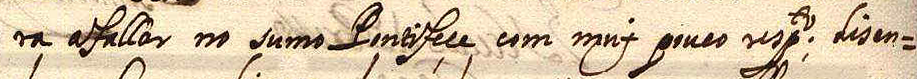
ra a fallar no sumo Pontifece com muy pouco resp.to disen
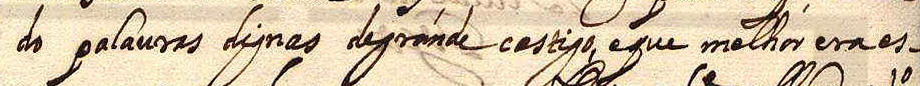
do palauras dignas de grande castigo, e que melhor era es
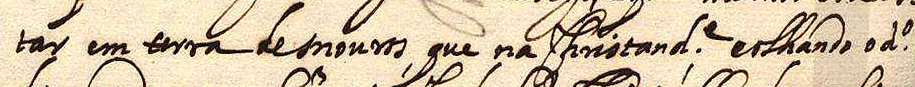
tar em terra de mouros que na Christand.e e olhando o d.o
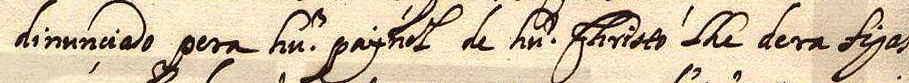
denunciado pera hū paynel de hū Christo lhe dera figas
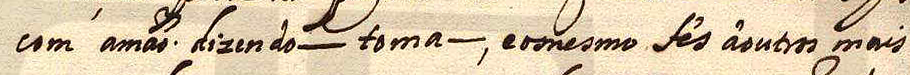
com a mão dizendo – toma –, e o mesmo fes á outros mais
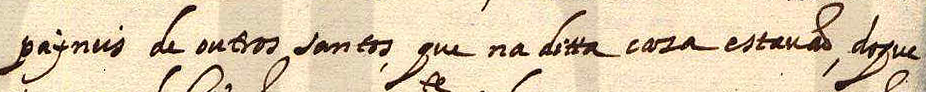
payneis de outros santos, que na ditta caza estauão, do que
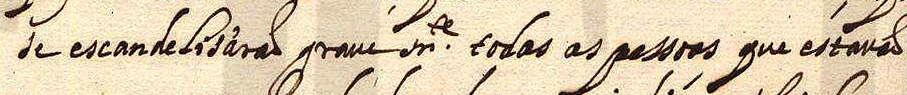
se escandelisaraõ grauem.te todas as pessoas que estauaõ
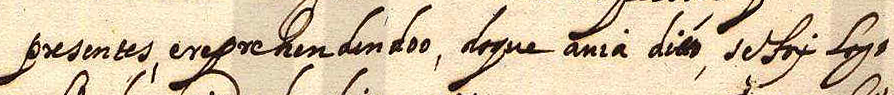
presentes, e reprehendendoo, do que auia ditto se foy Logo
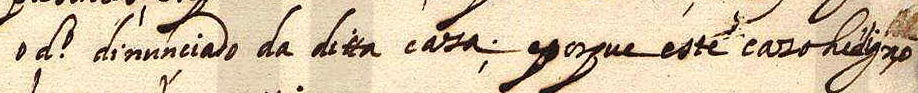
o d.o dinunciado da ditta caza; e porque este cazo he digno
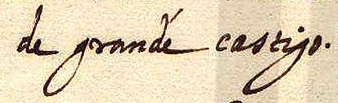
de grande castigo.
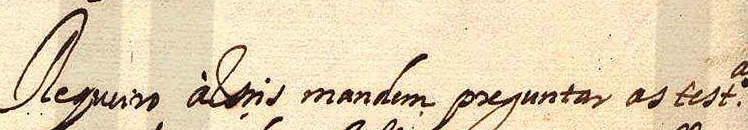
Requeiro a Vms mandem preguntar as test.a
